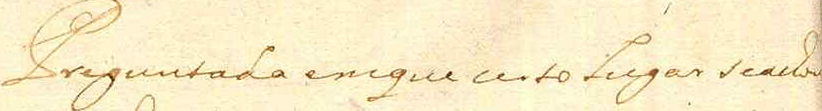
Preguntada em que certo Lugar se achou
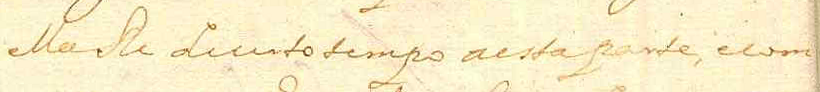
ella Re de certo tempo a esta parte, e com
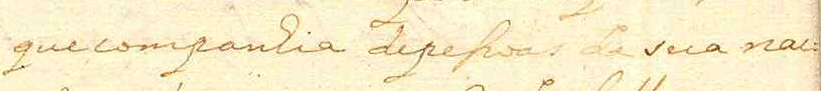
que companhia de pessoas da sua nac
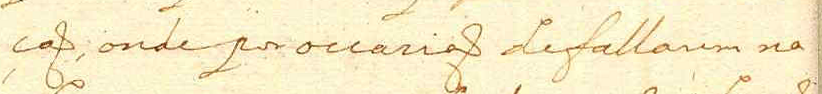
çaõ, onde por occaziaõ de fallarem na
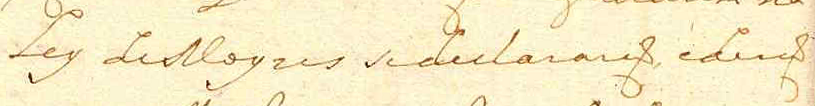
Ley de Moyzes se declararaõ e deraõ
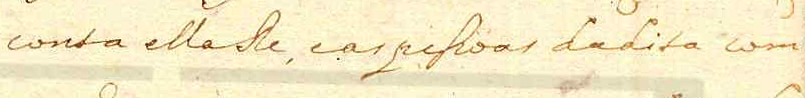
conta ella Re, e as pessoas da dita com
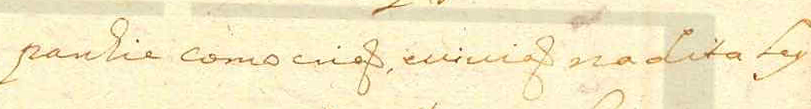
panhia como criaõ, e uiuiaõ na dita Ley
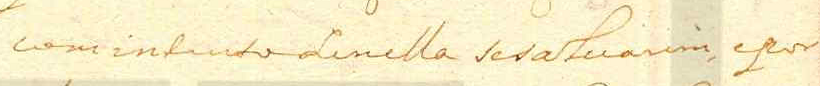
com intento de nella se saluarem, e por
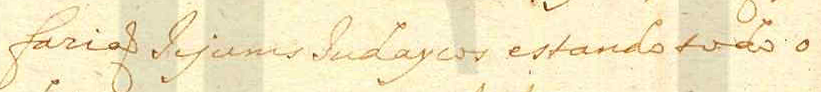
faziaõ Iejums Iudaycos estando todo o
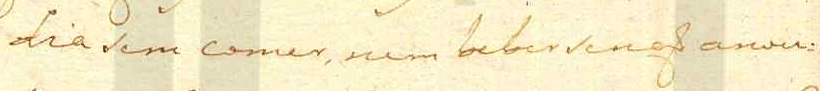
dia sem comer, nem beber senaõ a nou
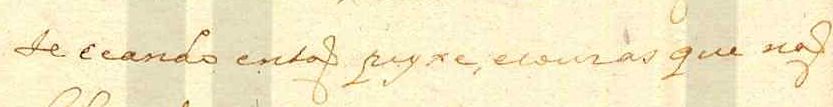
te ceando entaõ peyxe, e couzas que naõ
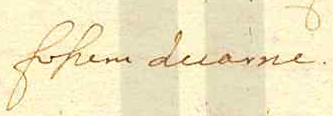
fossem de carne.
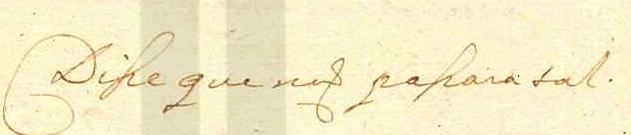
Disse que naõ passara tal.
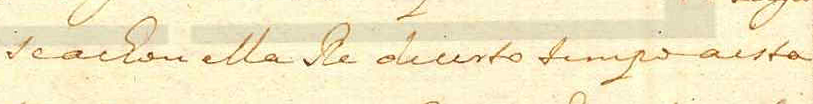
se achou ella Re de certo tempo a esta
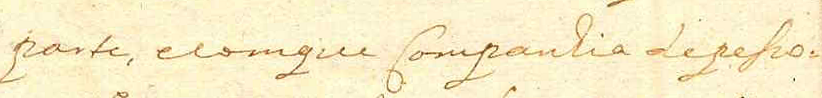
parte, e com que Companhia de pesso
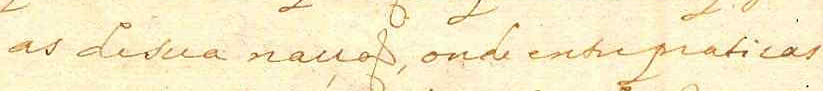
as de sua nacçaõ, onde entre praticas
